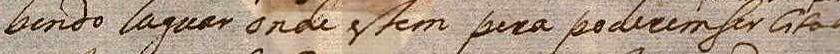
bendo luguar onde estam pera poderem ser Citadas
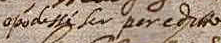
o podessē ser per edittos
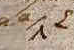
E
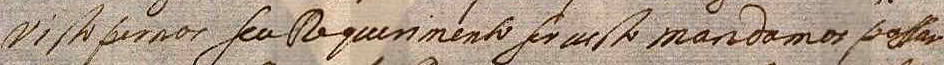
visto per nos seu Requerimento ser uisto mandamos passar
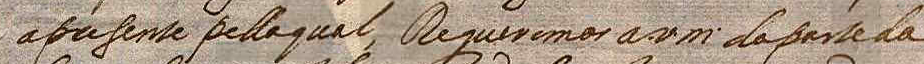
a presente pella qual, Requeremos a v. m. da parte da
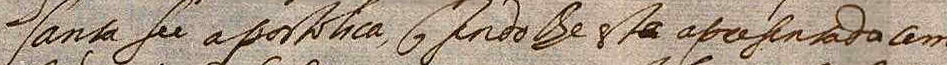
Santa See apostolica, q̄ sendo lhe esta apresentada com
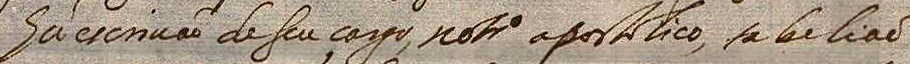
hū escriuaõ de seu cargo, notro apostolico, tabeliaõ
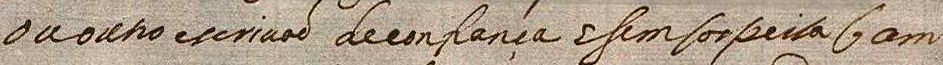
ou outro escriuaõ de confiança E sem sospeita q̄ com
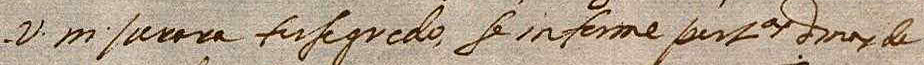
v. m. Jurara ter segredo, se informe per tas dinas de
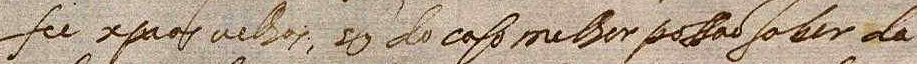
fee xpaõs uelhos, E q̄ do caso melhor possaõ saber da
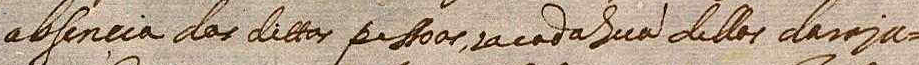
absencia das dittas pessoas, E a cada hua dellas dara ju
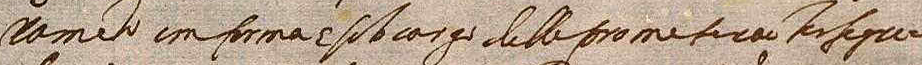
ramēto em forma E sob cargo delle prometeraõ ter segre
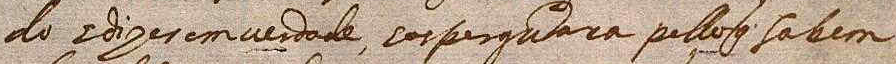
do E dizer em uerdade, E as perguntara pello q̄ sabem
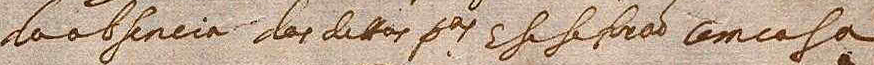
da absencia das dittas p.as E se se foraõ com casa
